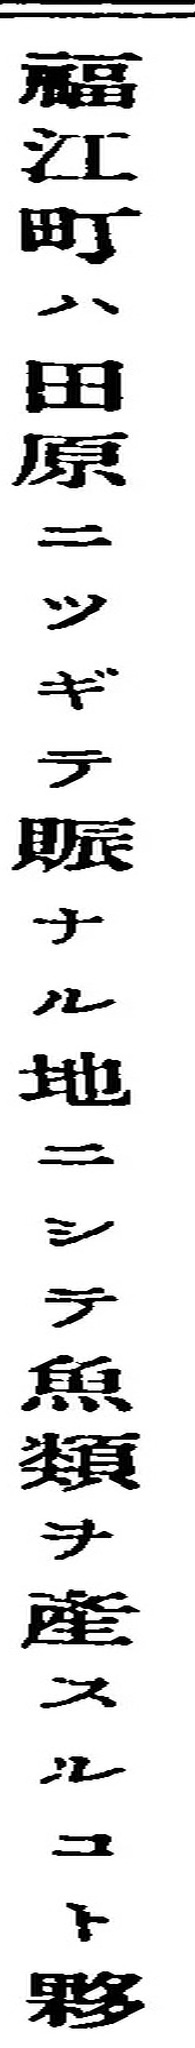福江町福江町ハ田原ニツギテ賑ナル地ニシテ魚類ヲ產スルコト夥

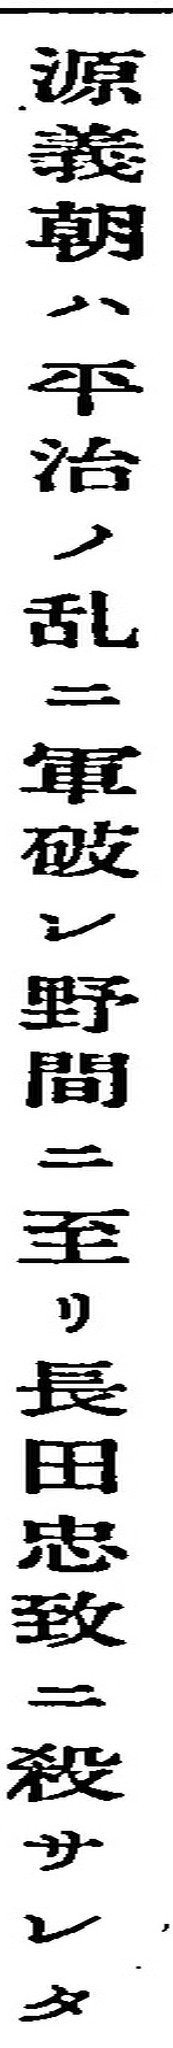源賴朝源賴朝ハ平治ノ乱ニ軍破レ野間ニ至リ永田忠致ニ殺サレタ
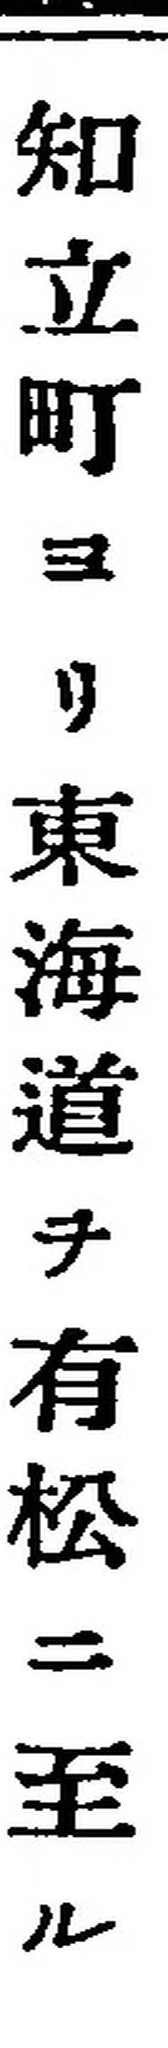知立町ヨリ東海道ヲ有松ニ至ル
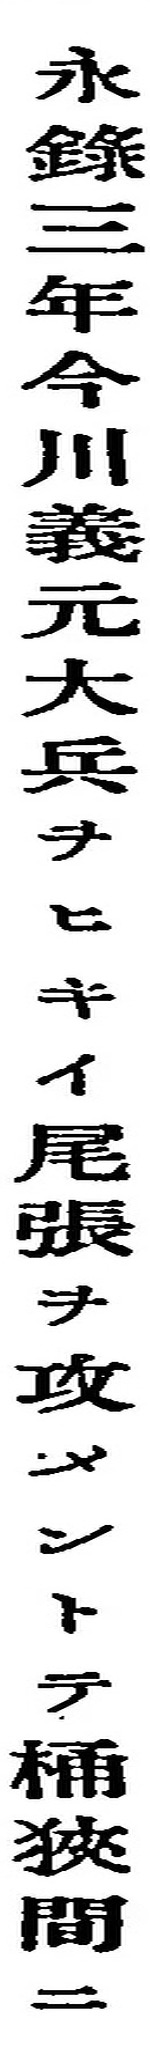桶狭間永錄三年今川義元大兵ヲヒキイ尾張ヲ攻メントテ桶狭間ニ
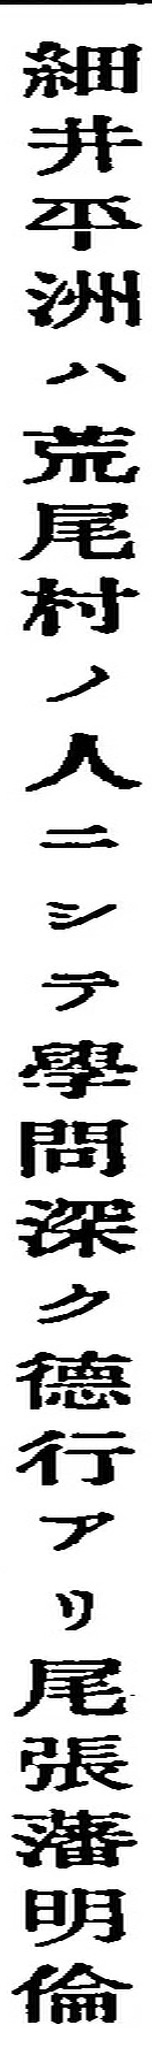細井平洲細井平洲ハ荒尾村ノ人ニシテ學問深ク德行アリ尾張藩明倫
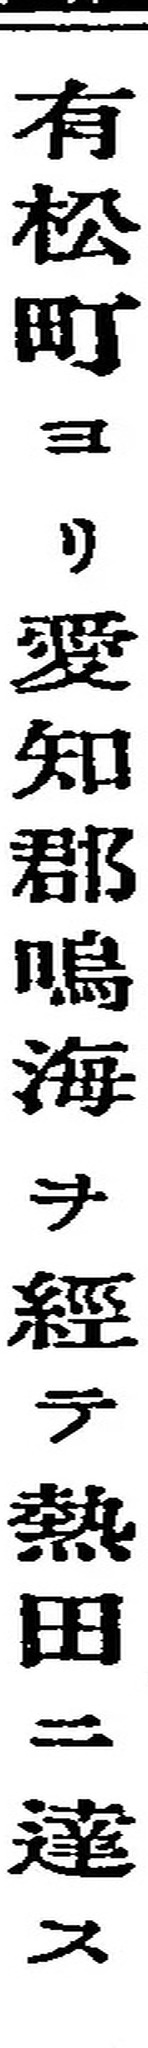愛知郡有松町ヨリ愛知郡鳴海ヲ經テ熱田ニ達ス
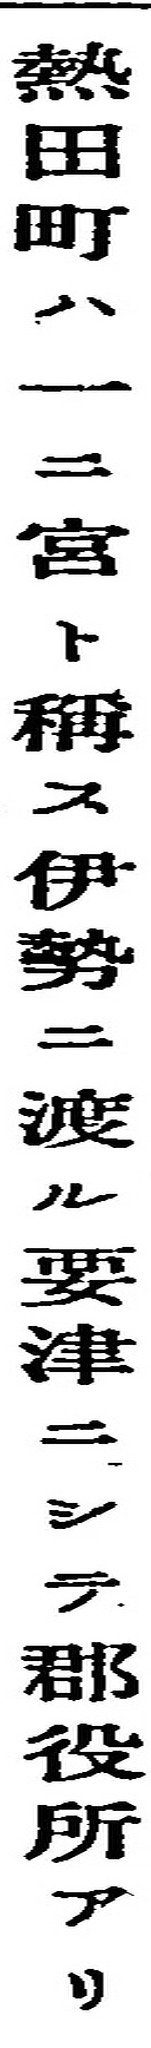熱田町熱田町ハ一ニ宮ト稱ス伊勢ニ渡ル要津ニシテ郡役所アリ
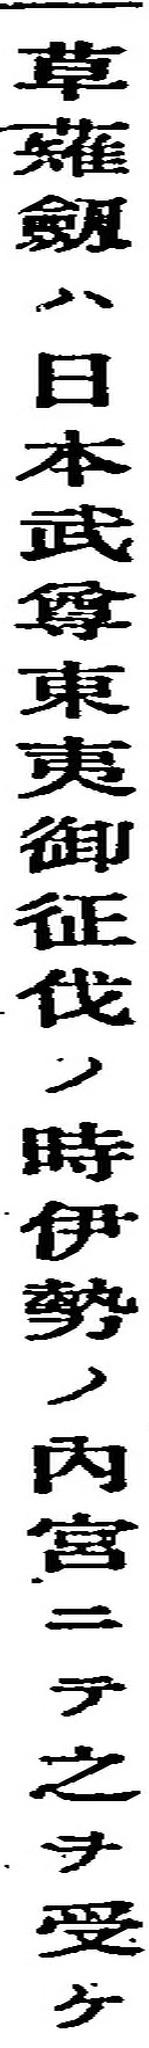草薙劍草薙劔ハ日本武尊東夷御征伐ノ時伊勢ノ内宮ニテ之ヲ受ケ
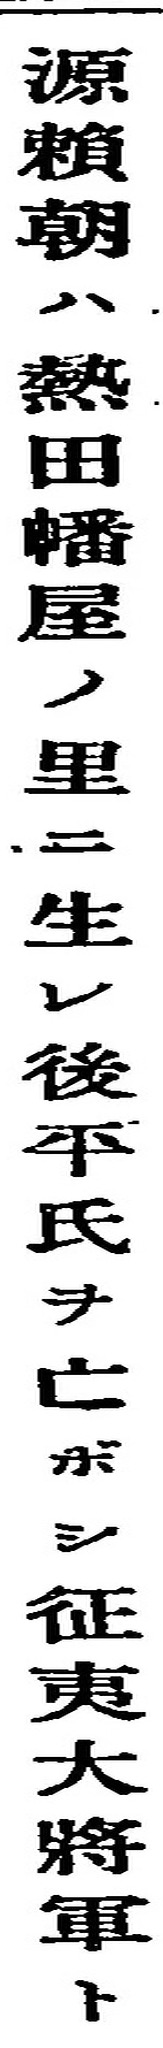源賴朝源賴朝ハ熱田幡屋ノ里ニ生レ後平氏ヲ亡ボシ征夷大將軍ト
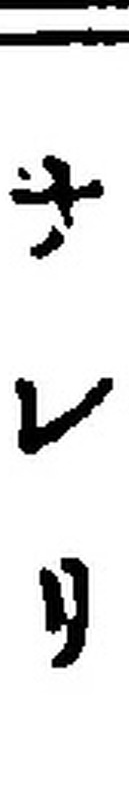ナレリ
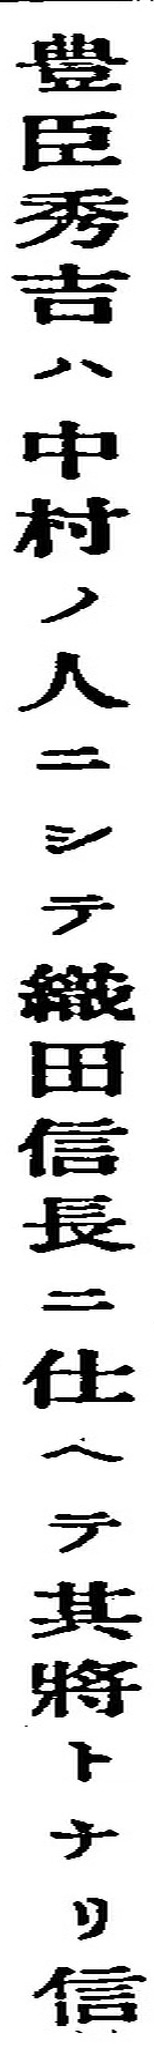豐臣秀吉豊臣秀吉ハ中村ノ人ニシテ織田信長ニ仕ヘテ其將トナリ信
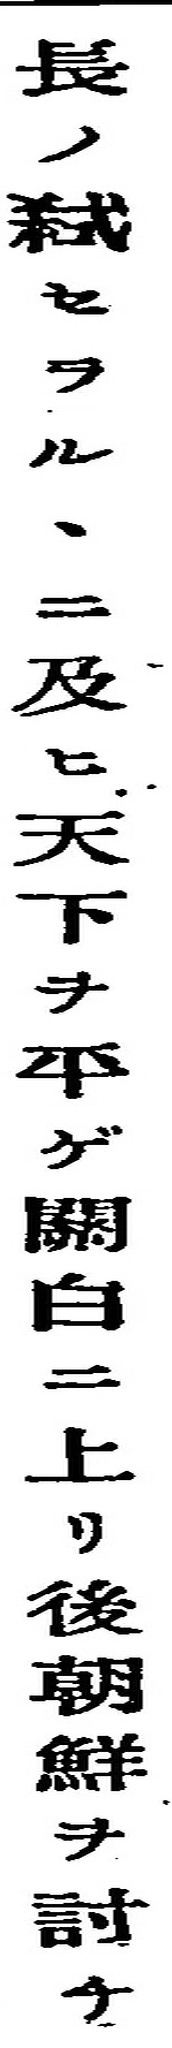長ノ弑セラルヽニ及ヒ天下ヲ平ゲ關白ニ上リ後朝鮮ヲ討チ
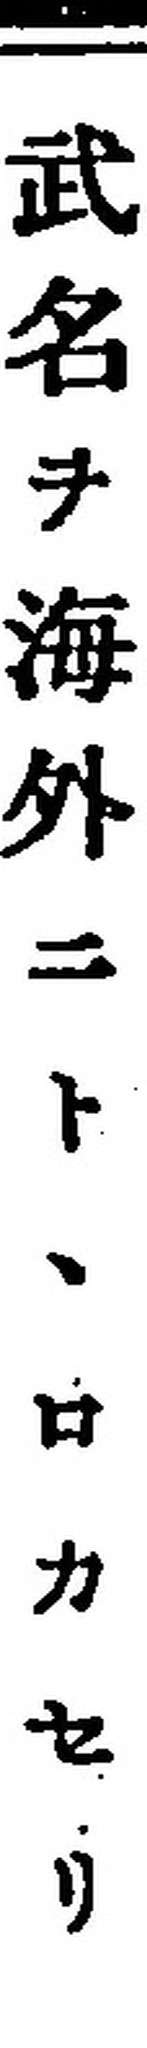武名ヲ海外ニトヽロカセリ
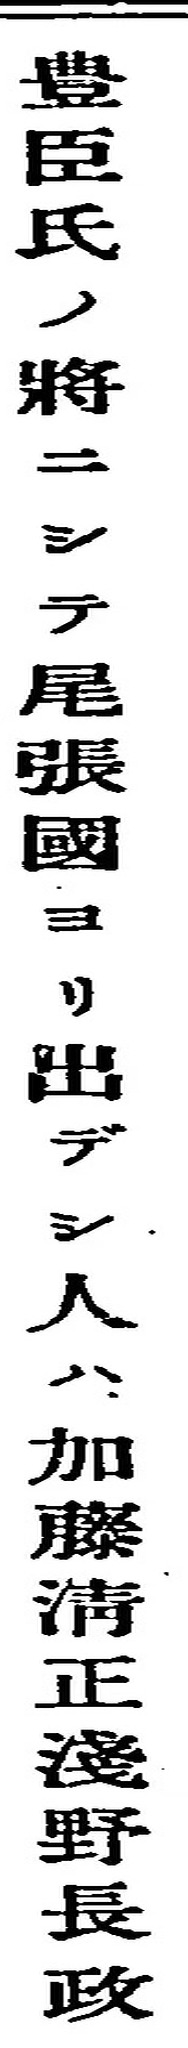豊臣氏ノ豊臣氏ノ將ニシテ尾張國ヨリ出デシ人ハ加藤淸正淺野長政
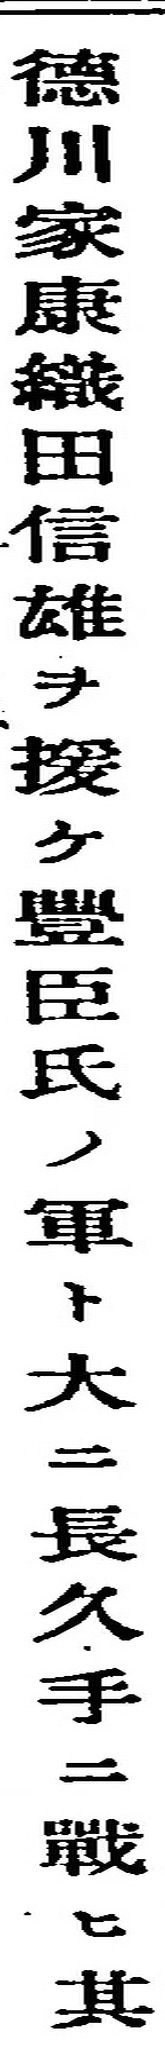長久手徳川家康織田信長ヲ援ケ豐臣氏ノ軍ト大ニ長久手ノ戰ヒ其

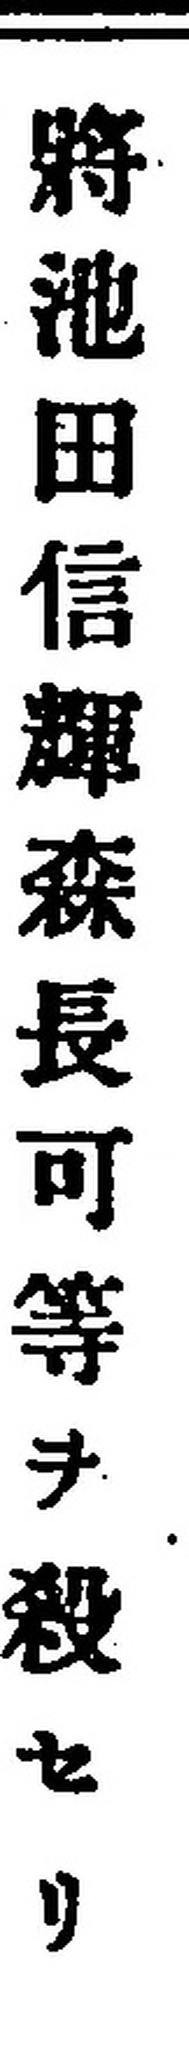將池田信輝森長可等ヲ殺セリ
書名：郷土誌
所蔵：国立国会図書館 National Diet Library, JAPAN
